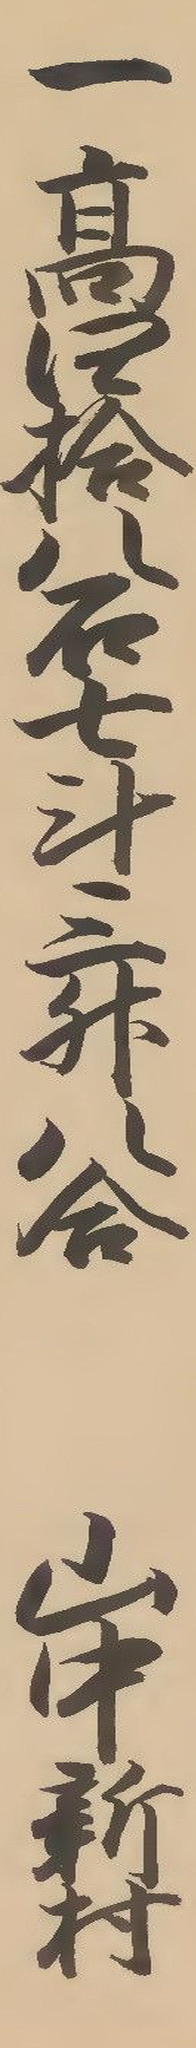一髙四拾八石七斗三升八合山中新村
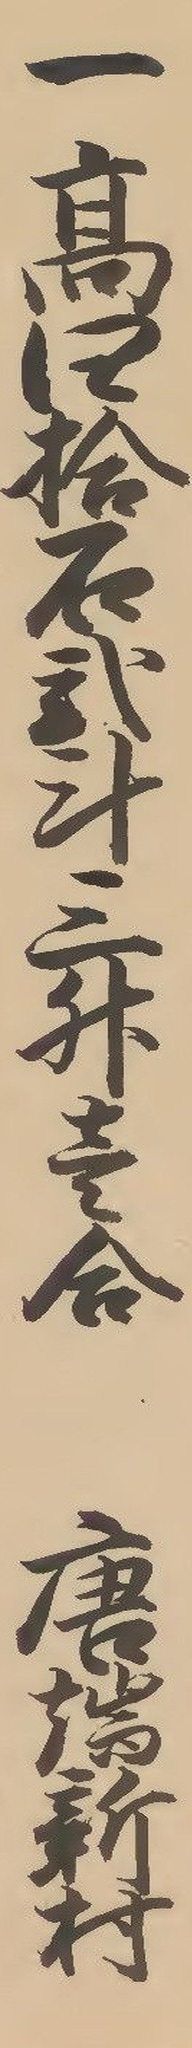一髙四拾石弐斗三升壱合唐端新村

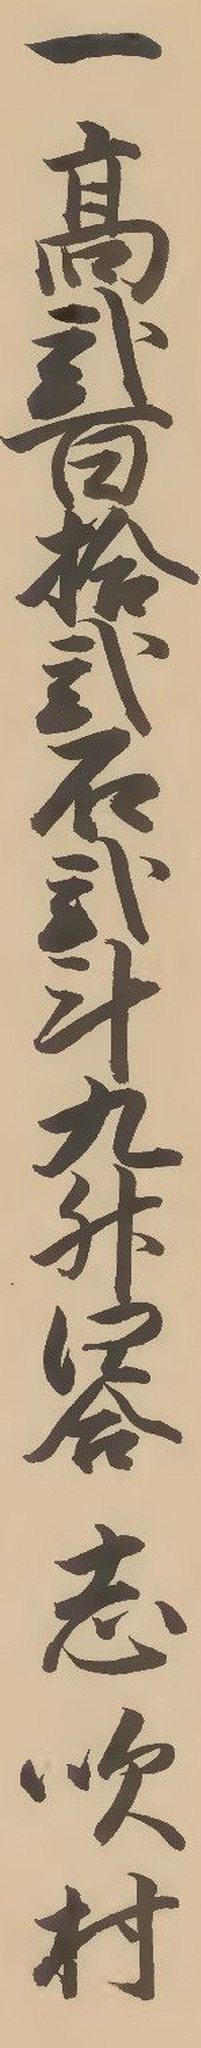一髙弐百拾弐石弐斗九升四合志吹村
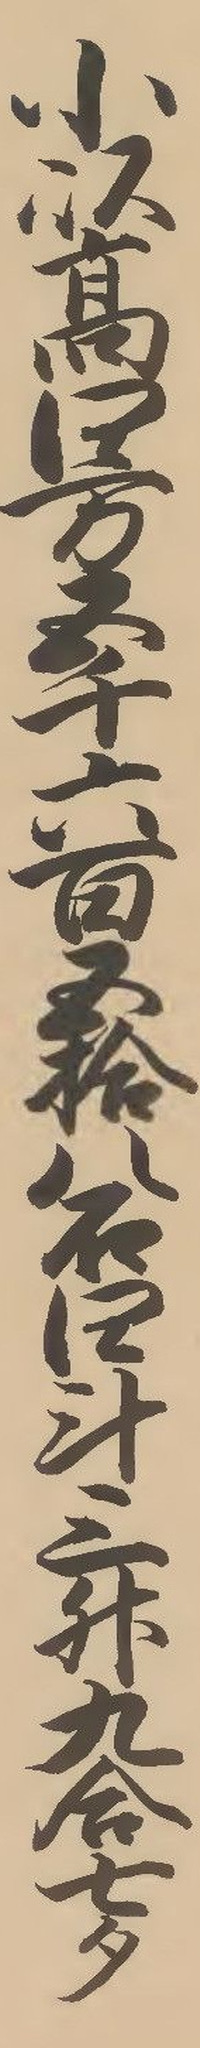小以髙四万五千六百五拾八石四斗三升九合七夕
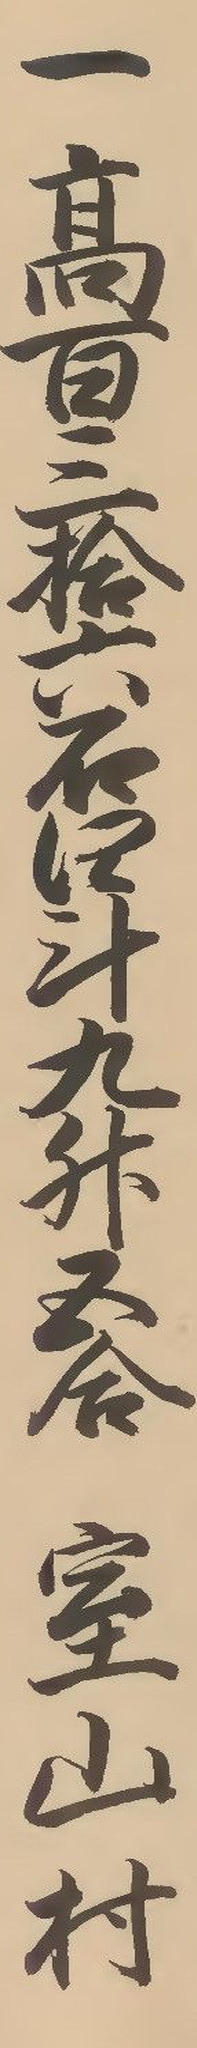一髙百三拾六石四斗九升五合室山村
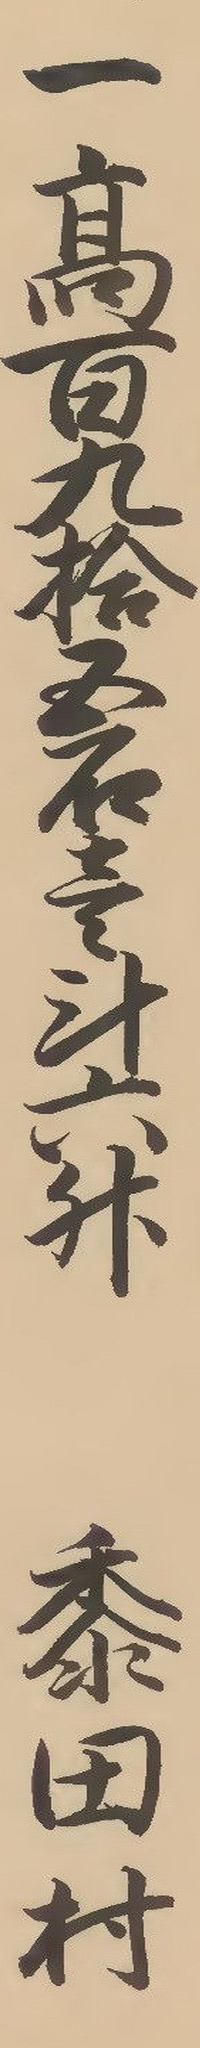一髙百九拾五石壱斗六升黍田村
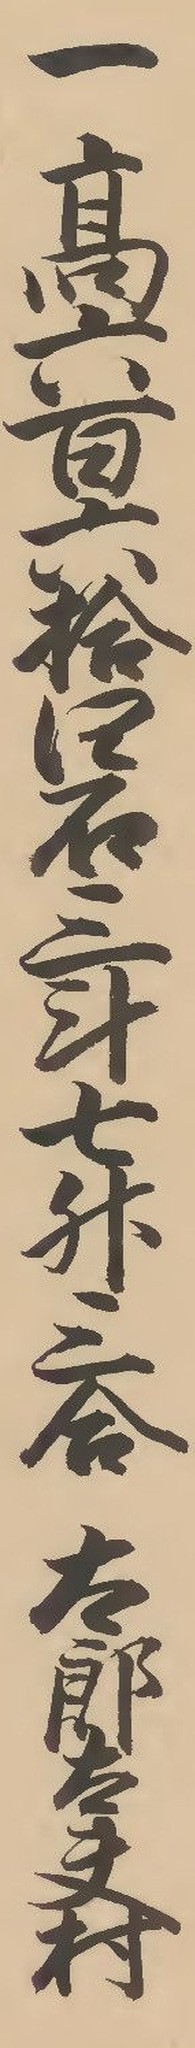一髙六百六拾四石三斗七升三合太郎太夫村

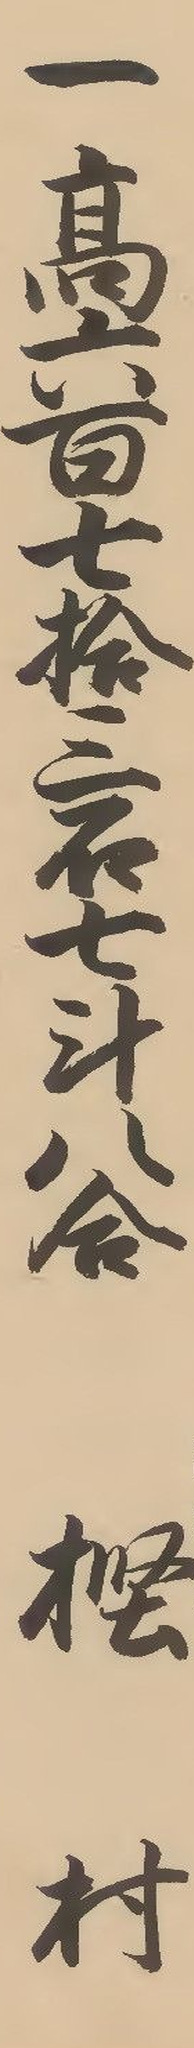一髙六百七拾三石七斗八合樫村
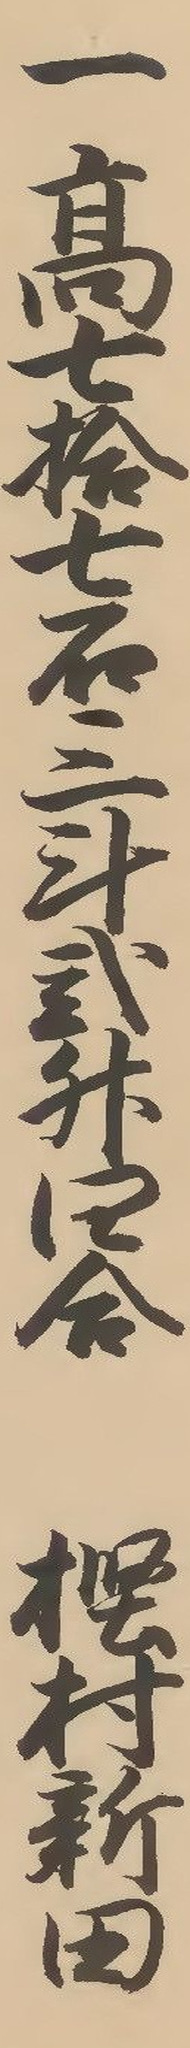一髙七拾七石三斗弐升四合樫村新田
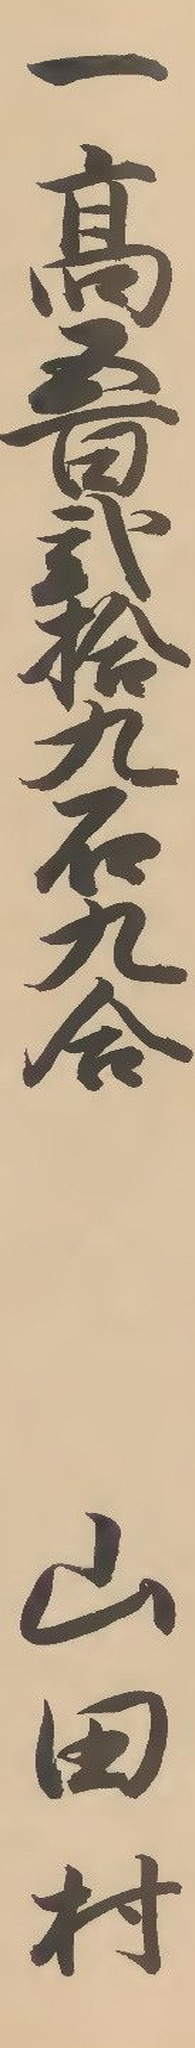一髙五百弐拾九石九合山田村
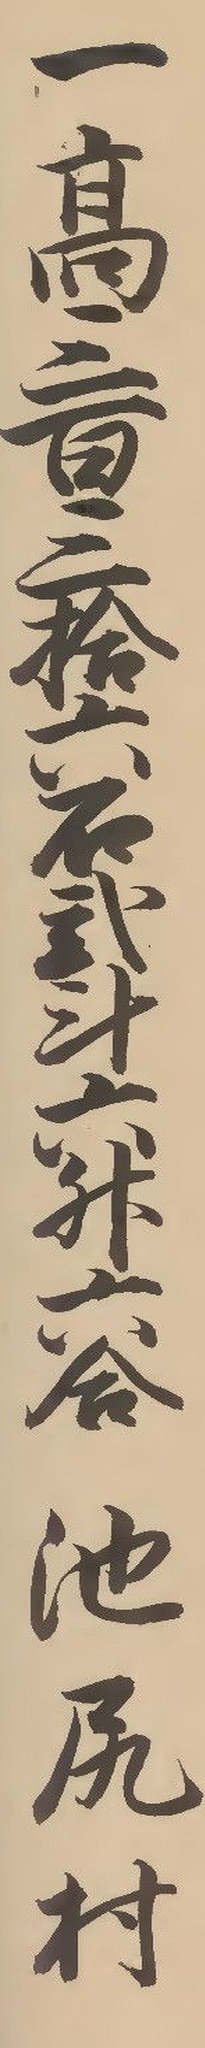一髙三百三拾六石二斗六升六合池尻村
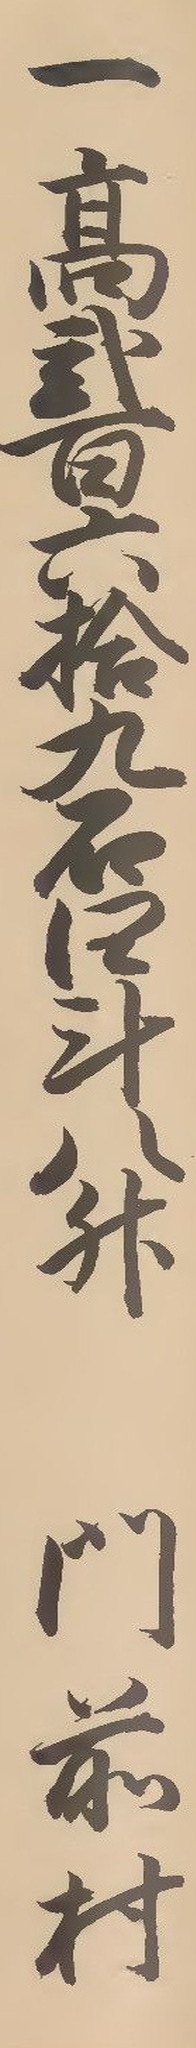一髙弐百六拾九石四斗八升門前村
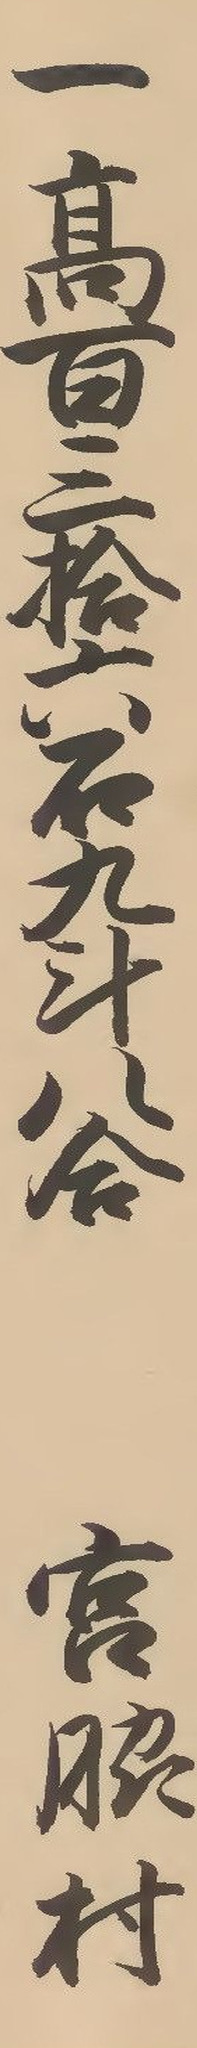一髙百三拾六石九斗八合宮脇村
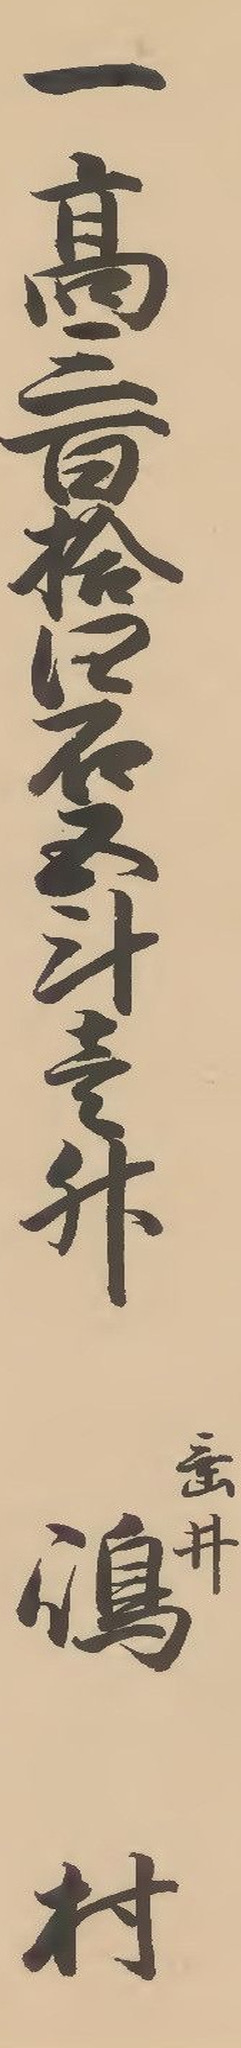一髙三百拾四石五斗壱升嶋村
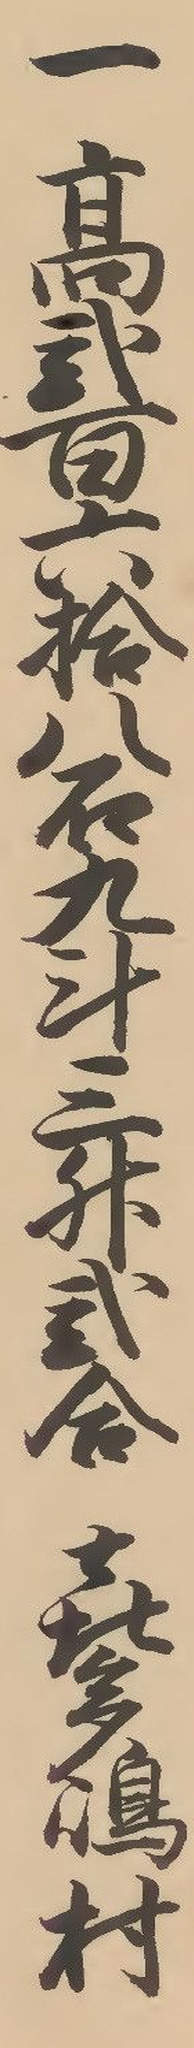一髙弐百六拾八石九斗三升弐合喜多嶋村

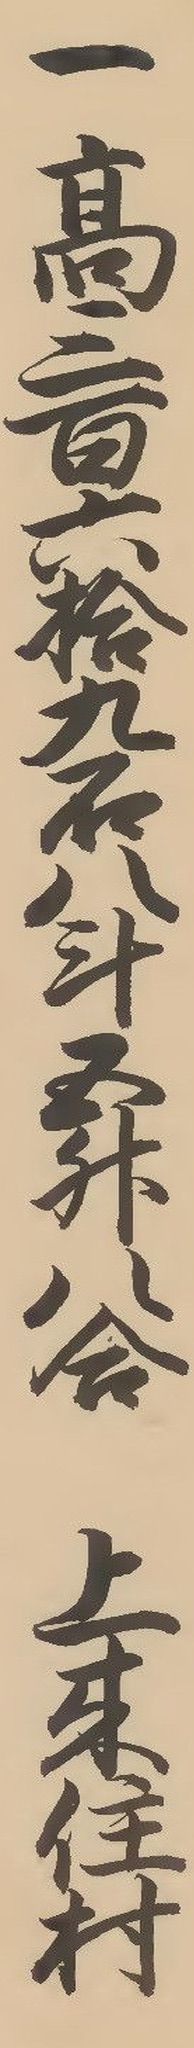一髙三百六拾九石八斗五升八合上来住村
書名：播磨国郷帳
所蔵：国立公文書館 National Archives of Japan
